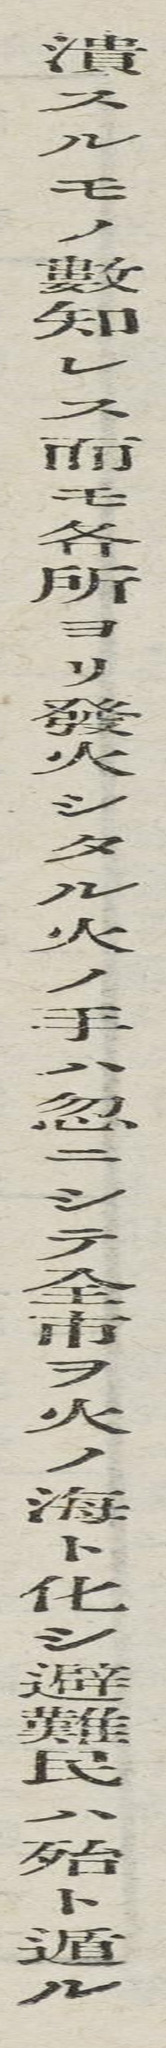潰スルモノ数知レス而モ各所ヨリ発火シタル火ノ手ハ忽ニシテ全市ヲ火ノ海ト化シ避難民ハ殆ト逃ル
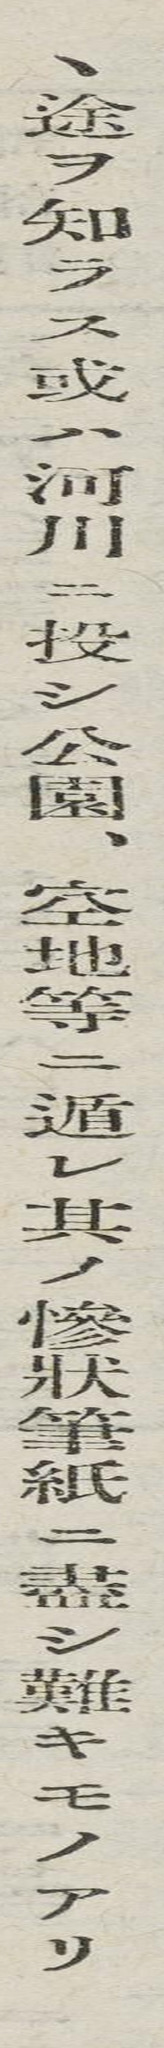ヽ途ヲ知ラス或ハ河川ニ投シ公園、空地等ニ逃レ其ノ惨状筆紙ニ尽シ難キモノアリ
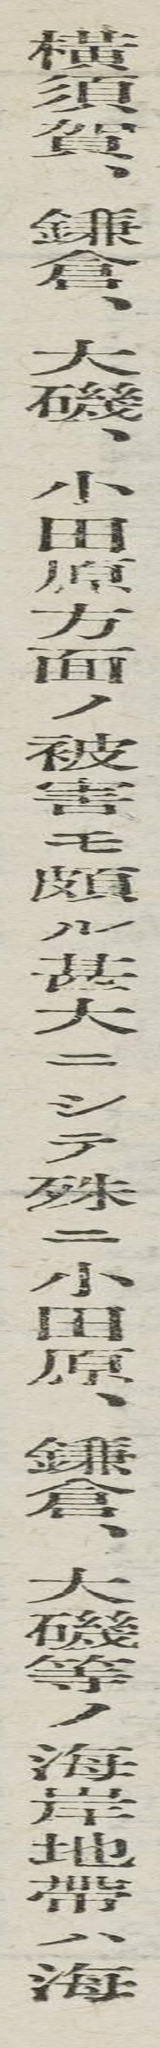横須賀、鎌倉、大磯、小田原方面ノ被害モ頗ル甚大ニシテ殊ニ小田原、鎌倉、大磯等ノ海岸地帯ハ海
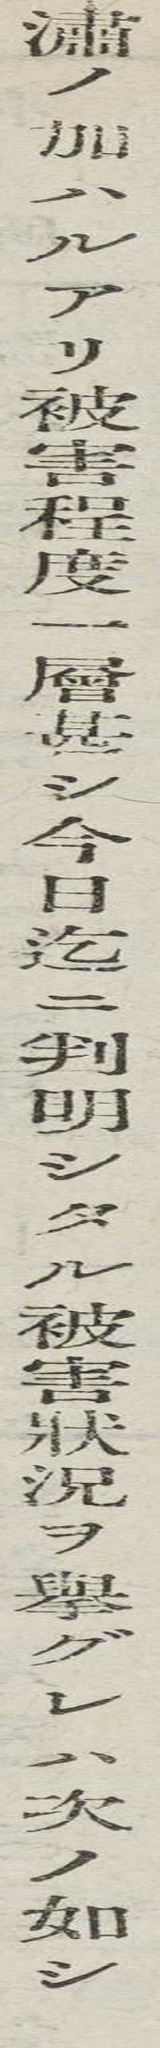潚ノ加ハルアリ被害程度一層甚シ今日迄ニ判明シタル被害状況ヲ挙グレハ次ノ如シ
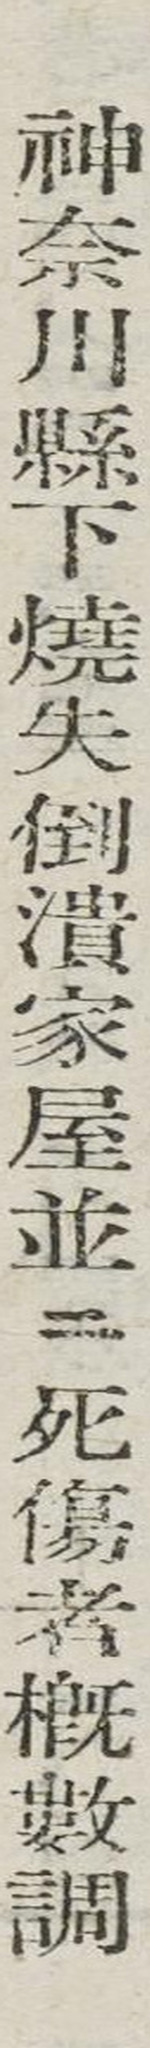神奈川県下焼失倒潰家屋並ニ死傷者概数調
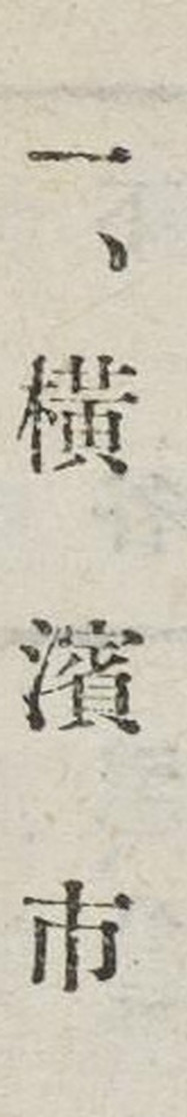一、横浜市
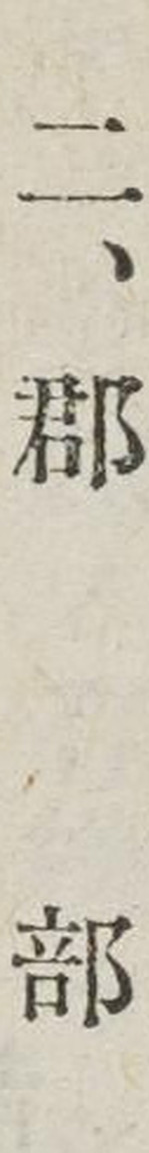ニ、郡部
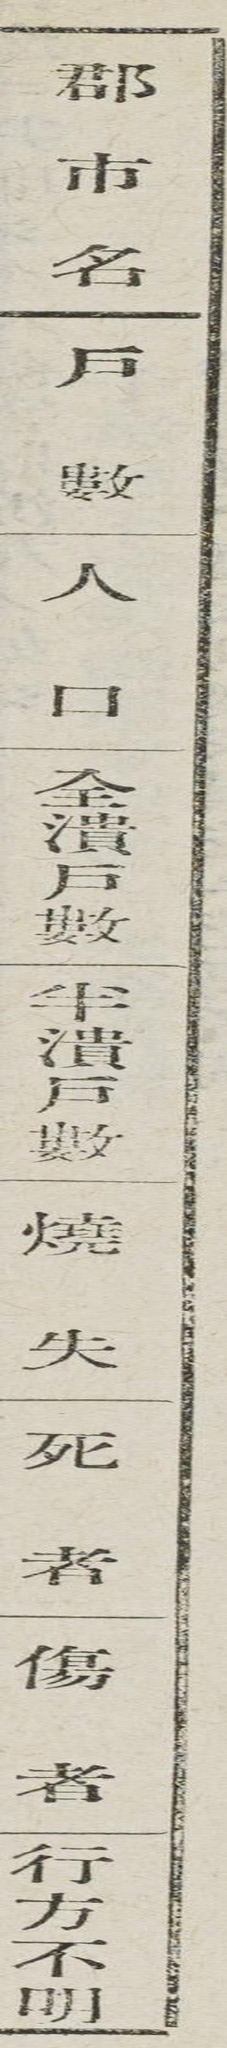郡市名戸数人口全潰戸数半潰戸数焼失死者傷者行方不明

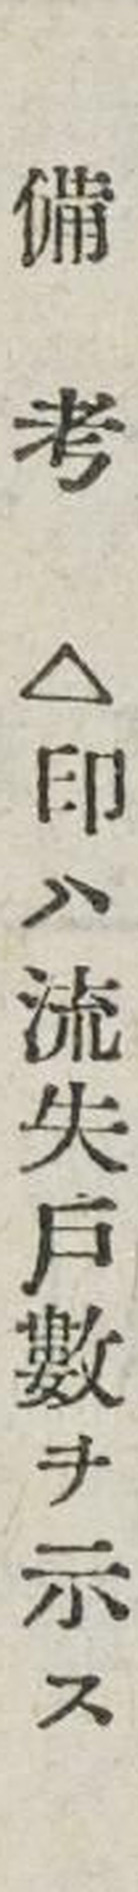備考△印ハ流失戸数ヲ示ス
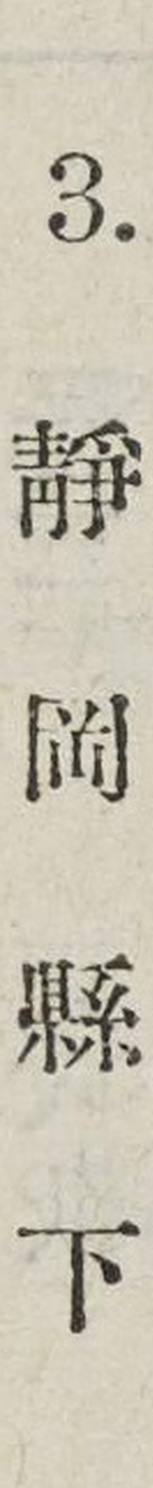３.静岡県下
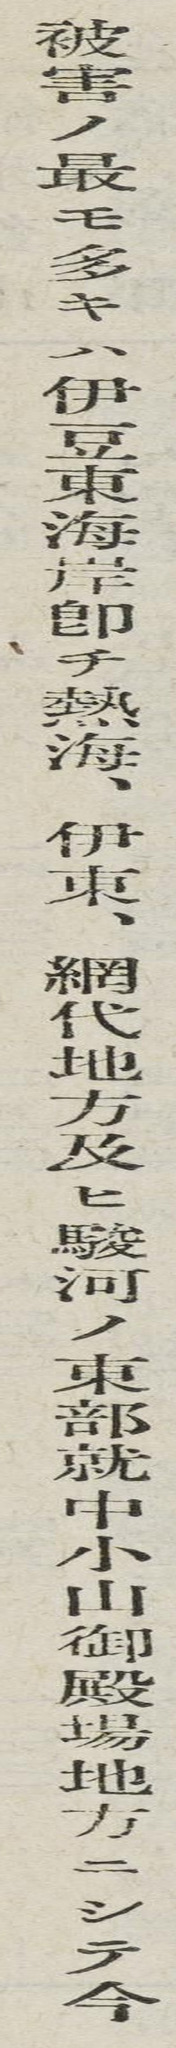被害ノ最モ多キハ伊豆東海岸即チ熱海、伊東、網代地方及ヒ駿河ノ東部就中小山御殿場地方ニシテ今
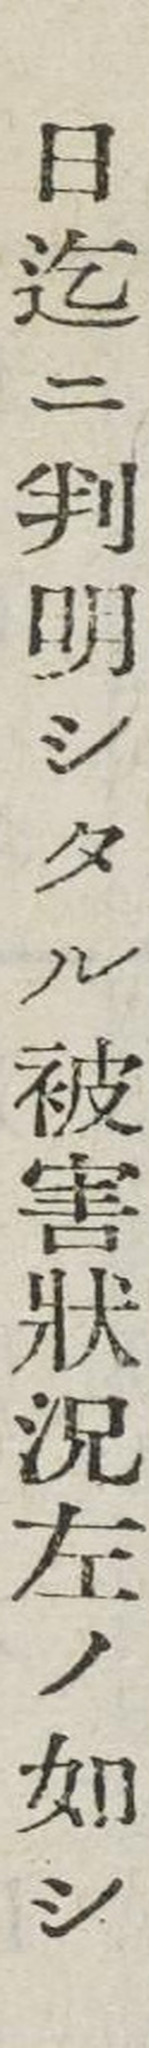日迄ニ判明シタル被害状況左ノ如シ
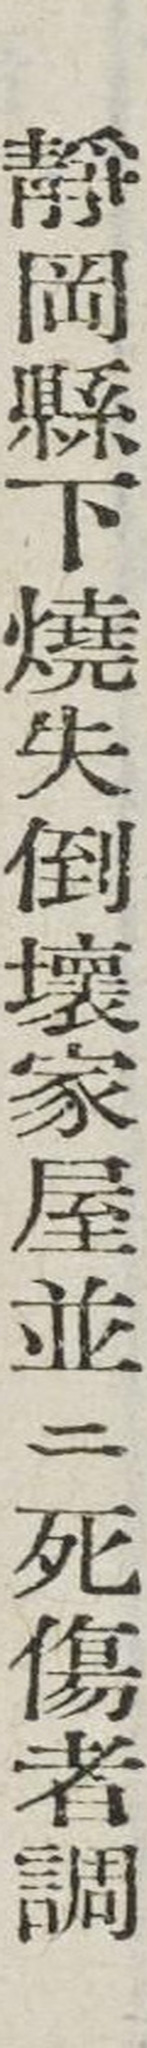静岡県下焼失倒壊家屋並ニ死傷者調
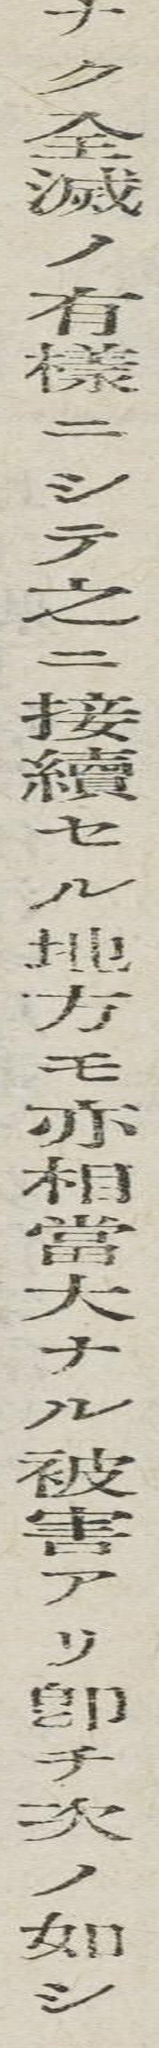ナク全滅ノ有様ニシテ之ニ接続セル地方モ亦相当大ナル被害アリ即チ次ノ如シ
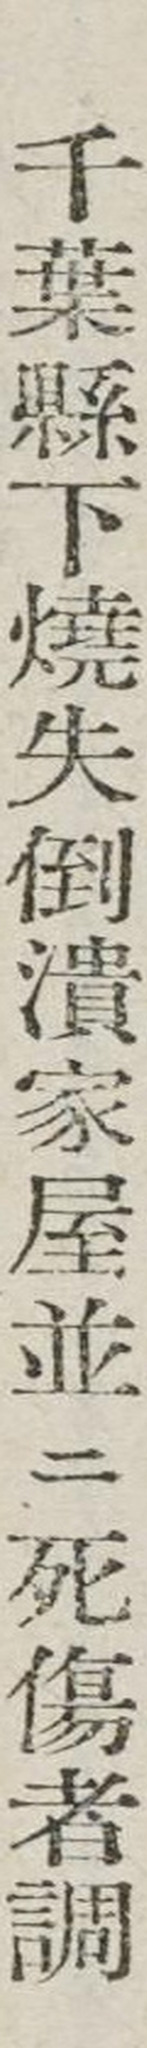千葉県下焼失倒壊家屋並ニ死傷者調

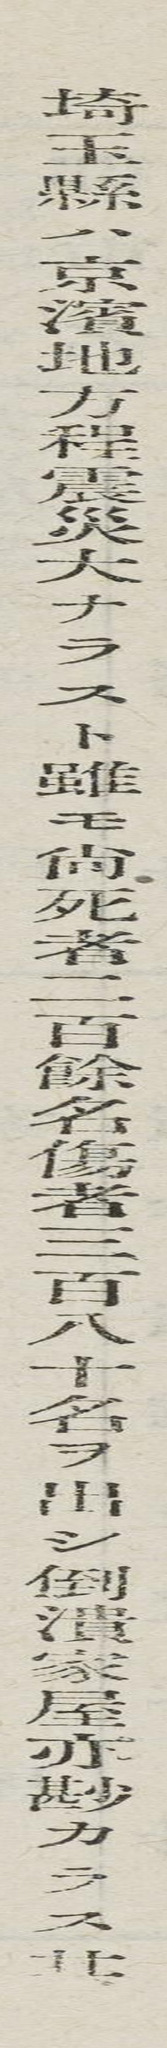埼玉県ハ京浜地方程震災大ナラスト雖モ尚死者二百余名傷者三百八十名ヲ出シ倒潰家屋亦少カラス其
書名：震災被害状況並救護施設概要
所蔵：東京大学地震研究所図書室 Earthquake Research Institute Library, The University of Tokyo, JAPAN
